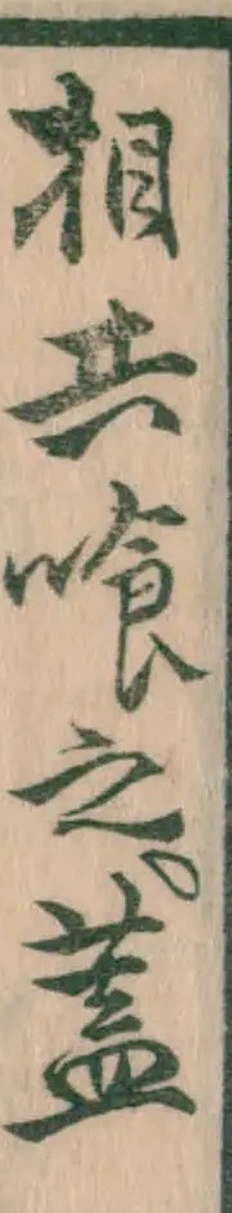相共喰之。蓋
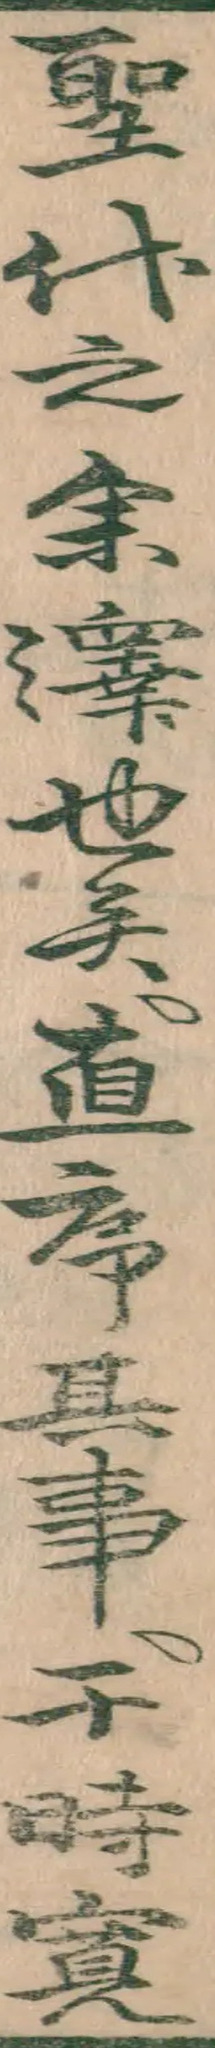聖代之余澤也矣。直序其事。于時寛
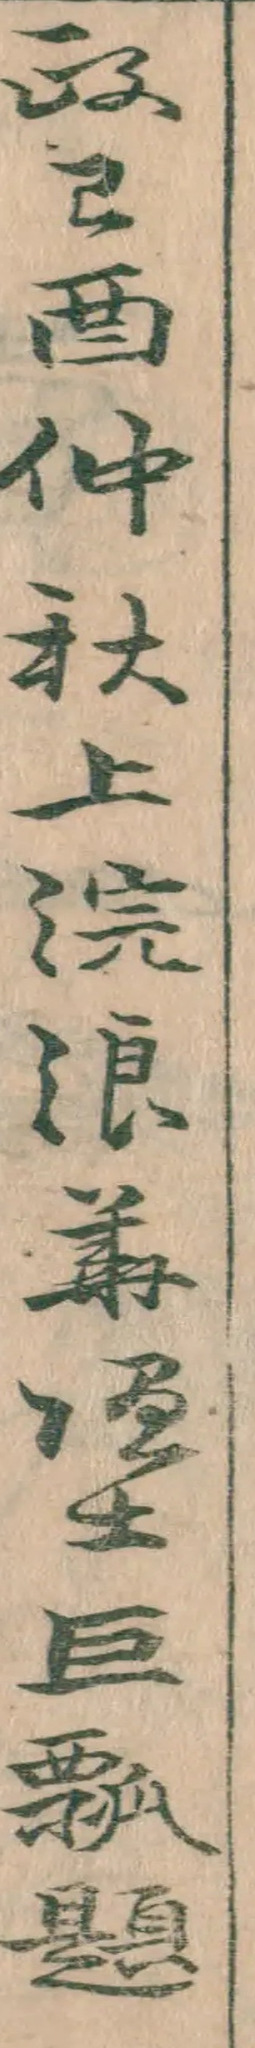政己酉仲秋上浣浪華隠士巨瓢題

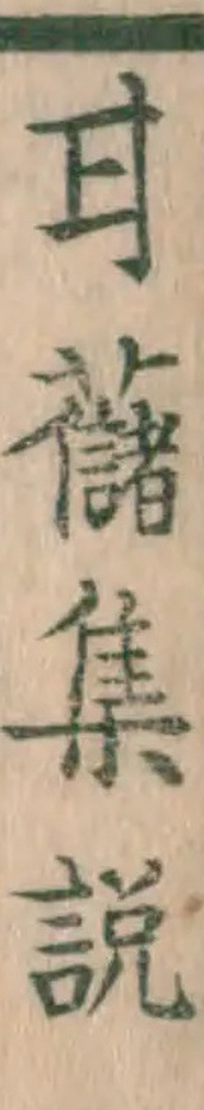甘藷集説

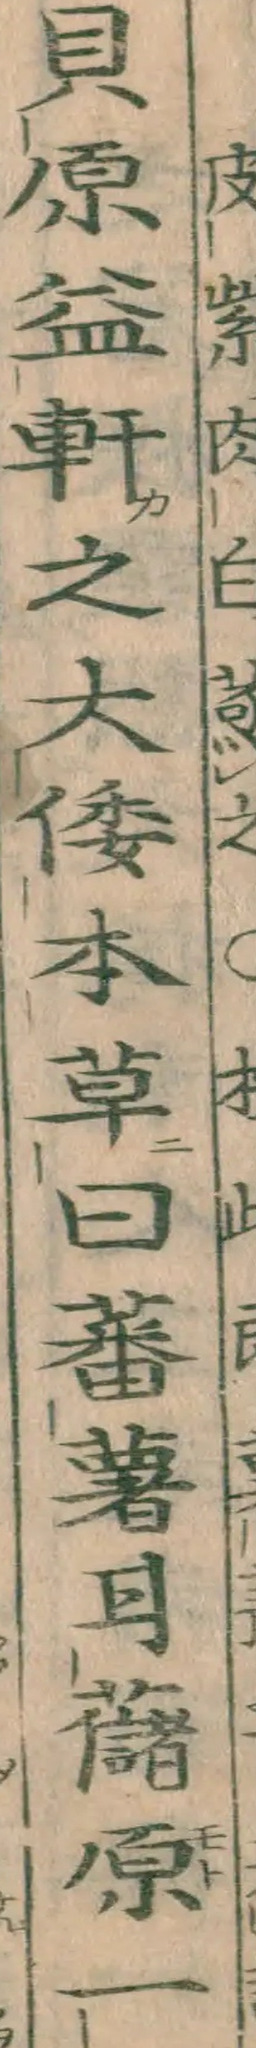貝-原益-軒之大-倭-本-草-曰蕃-薯甘-藷原一-
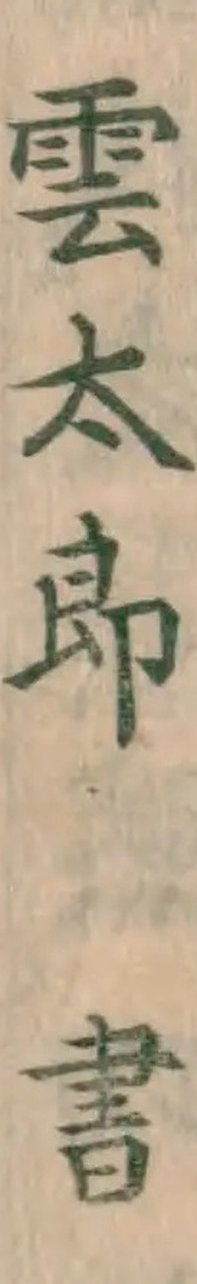雲太郎書
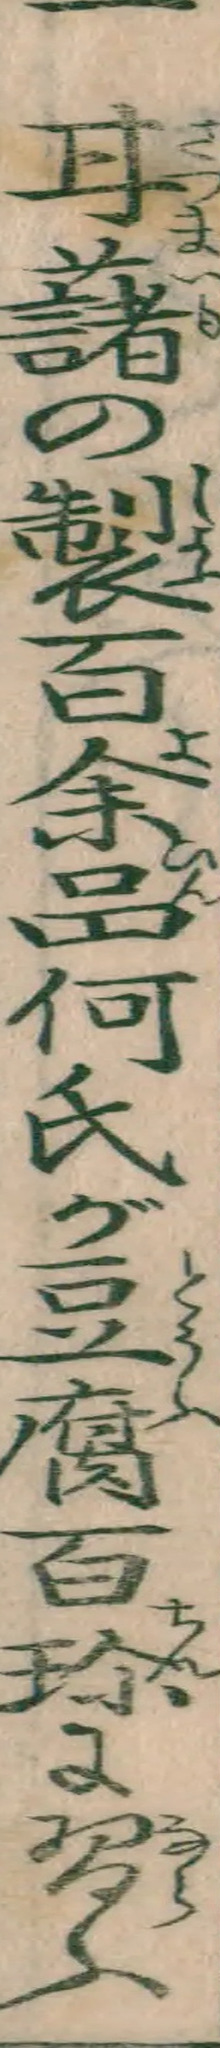一甘藷の製百余品何氏が豆腐百珍に習ふ
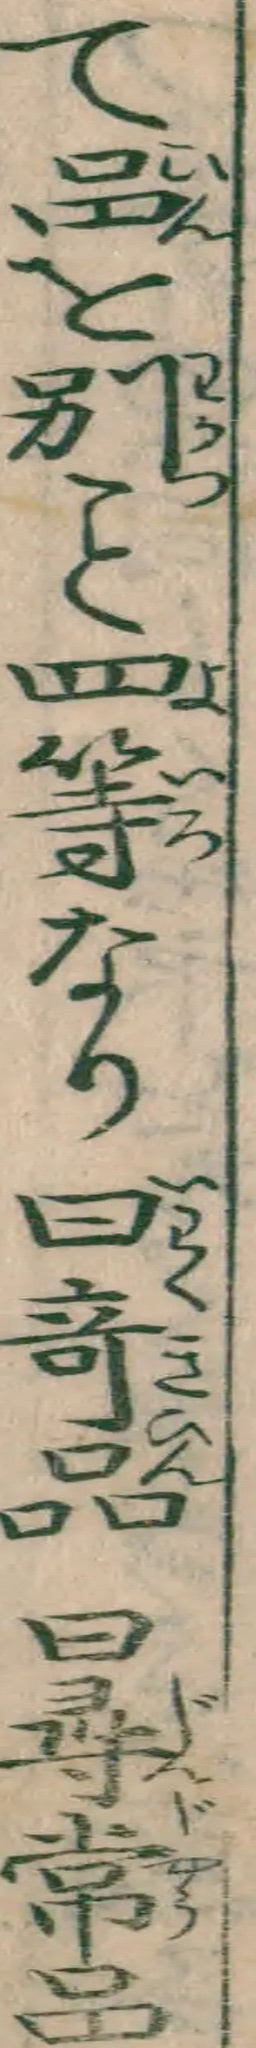て品を別こと四等なり曰奇品曰尋常品
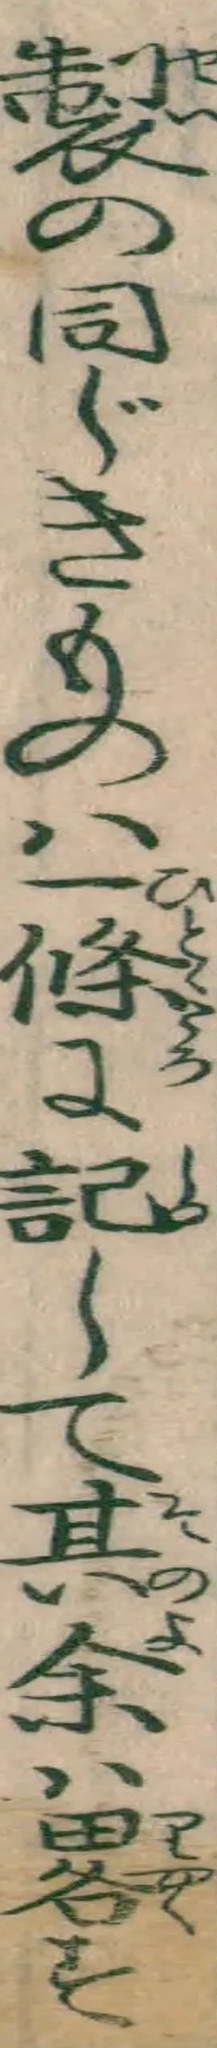一製の同じきものは一条に記して其余は略す
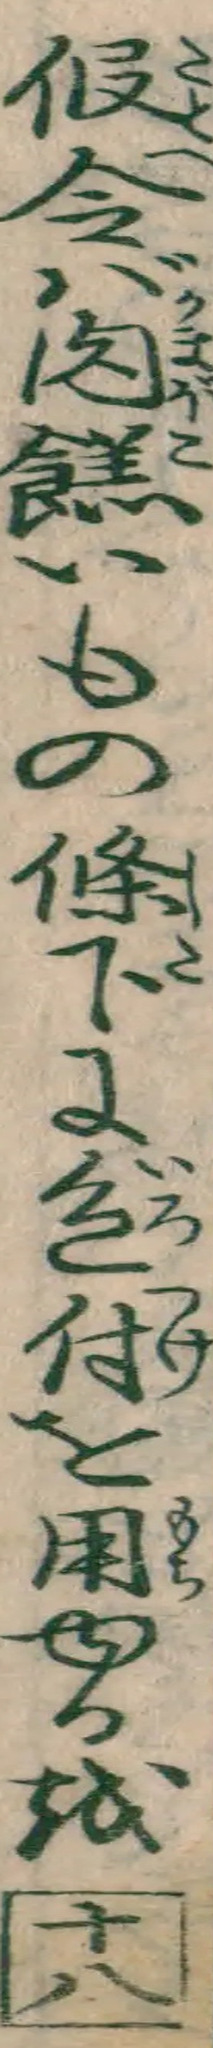仮令ば肉餻いもの条下に色付を用ゆるを[十八]
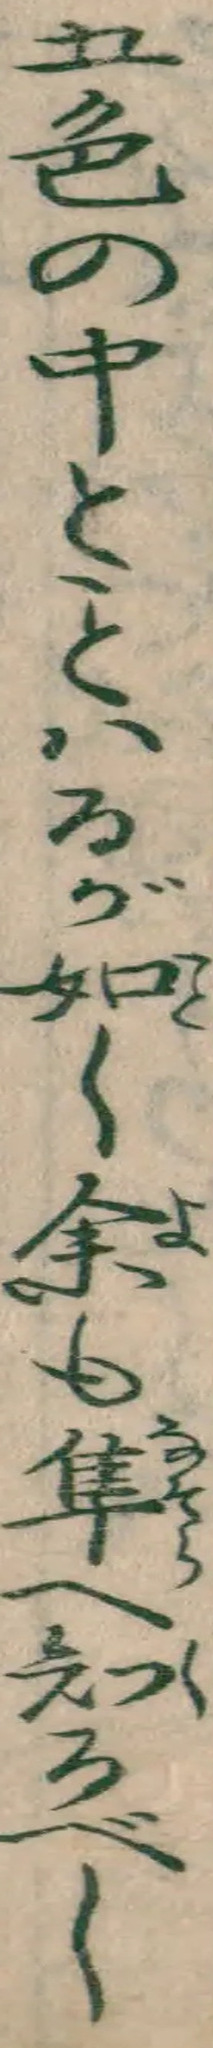五色の中とことはるが如し余も隼へ知るべし
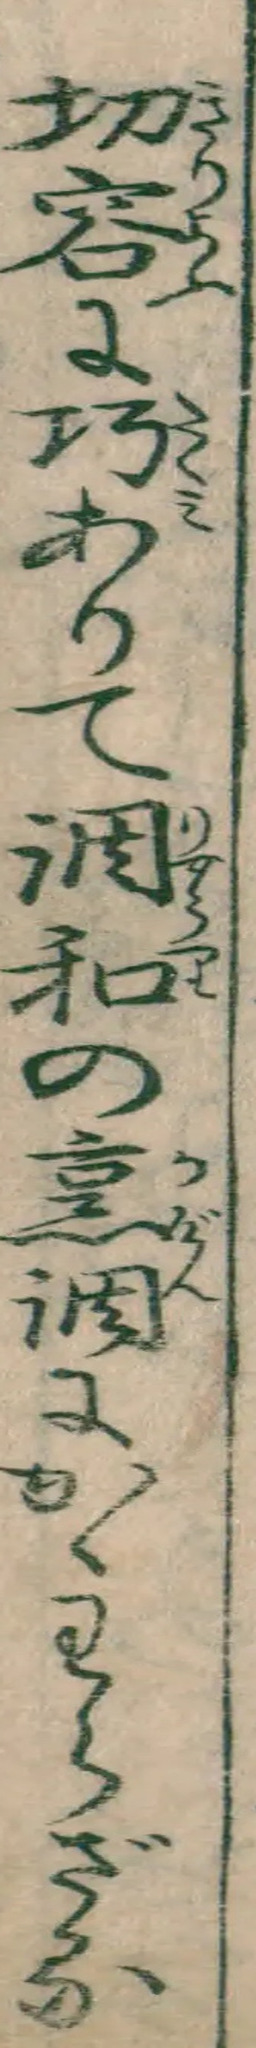一切容に巧ありて調和の烹調にかゝわらざる
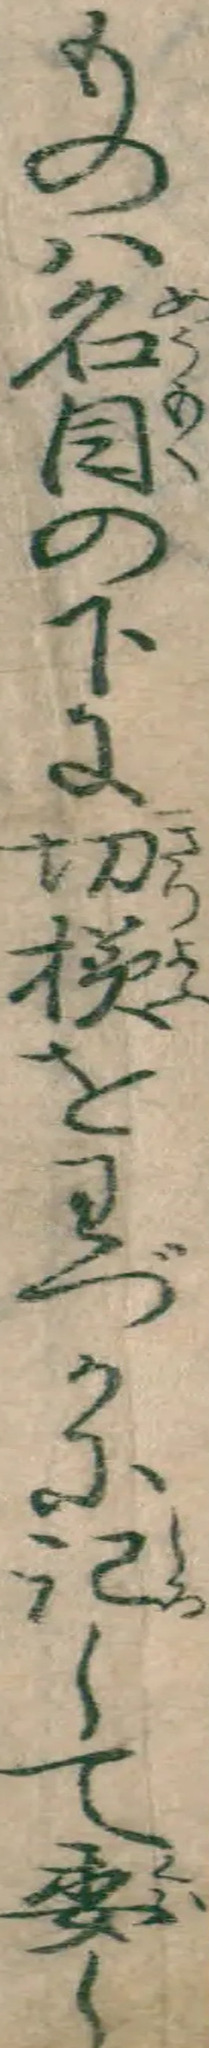ものは名目の下に切様をわづかに記して委し
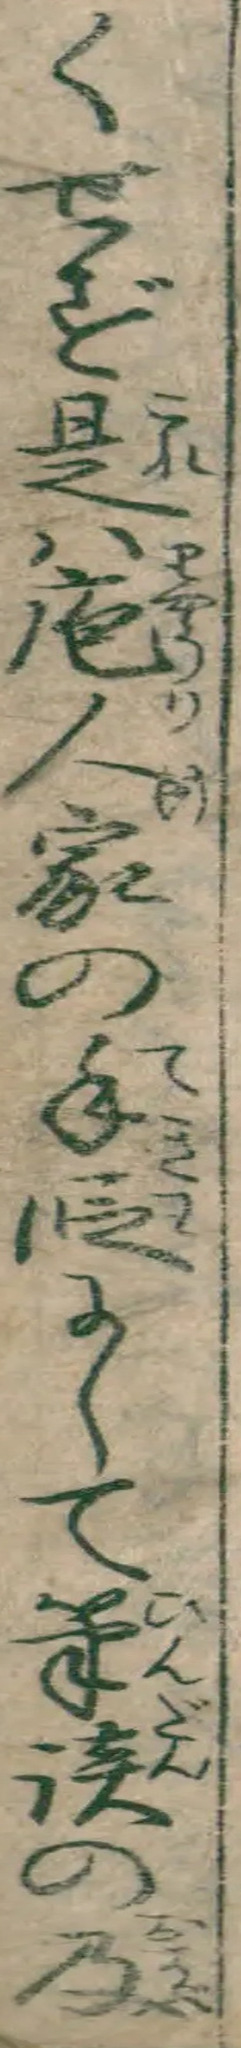くせず是は庖人家の手段にして筆談の及

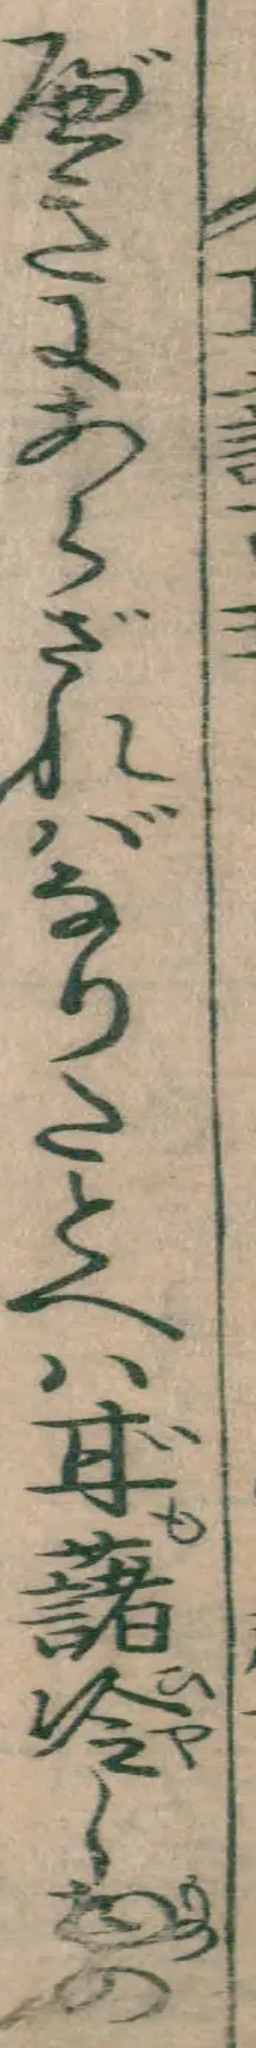べきにあらざればなりたとへは甘薯冷し物の
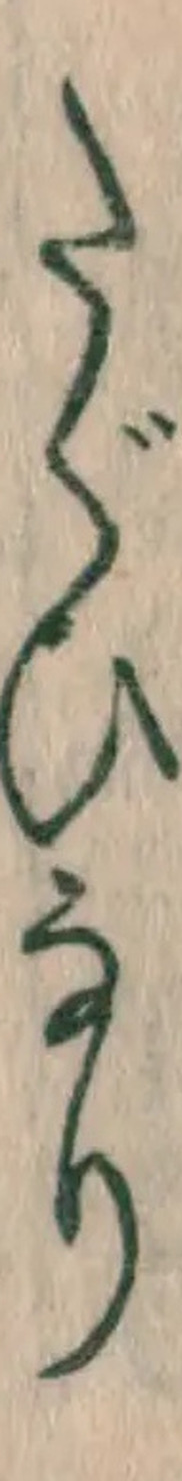たぐひなり
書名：甘藷百珍
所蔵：国立国会図書館 National Diet Library, JAPAN
